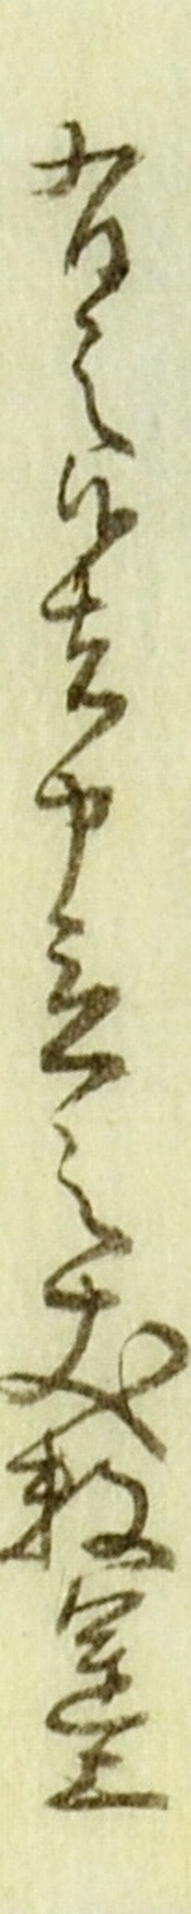有之候者申立之丈数運上
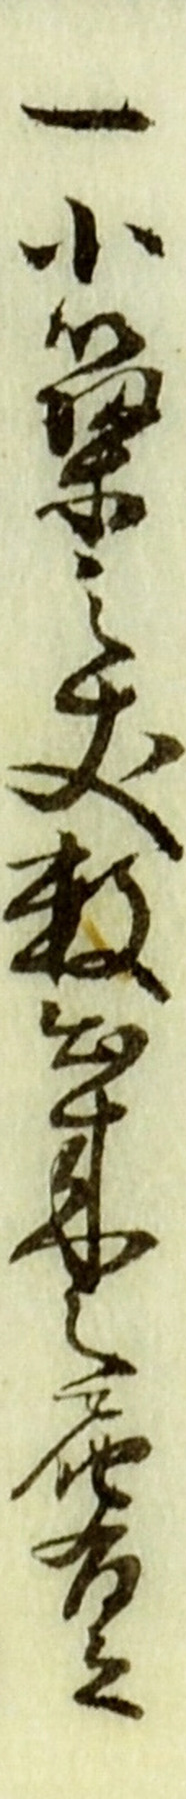一小簗之丈数出来之届有之
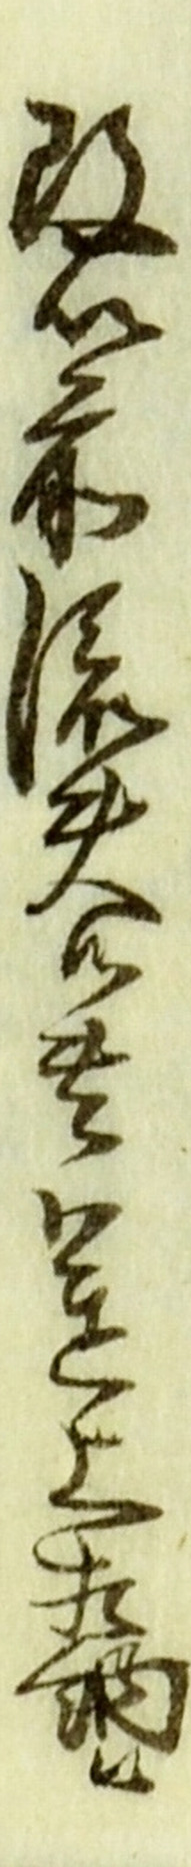改以前流失候共運上相納候
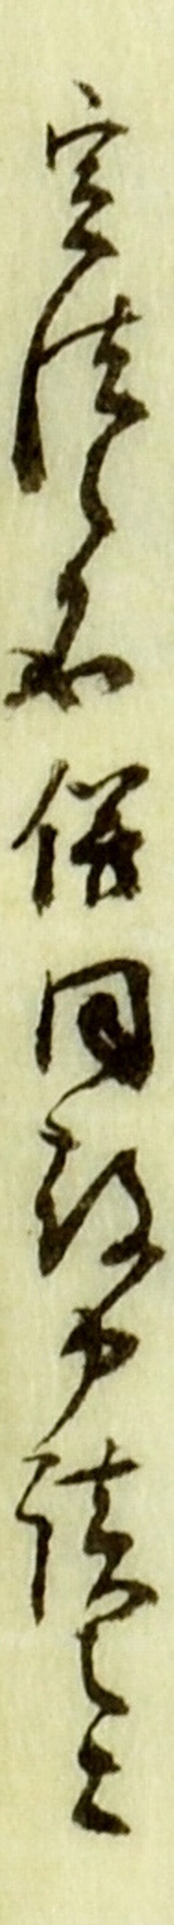定法之名併同存申談之上
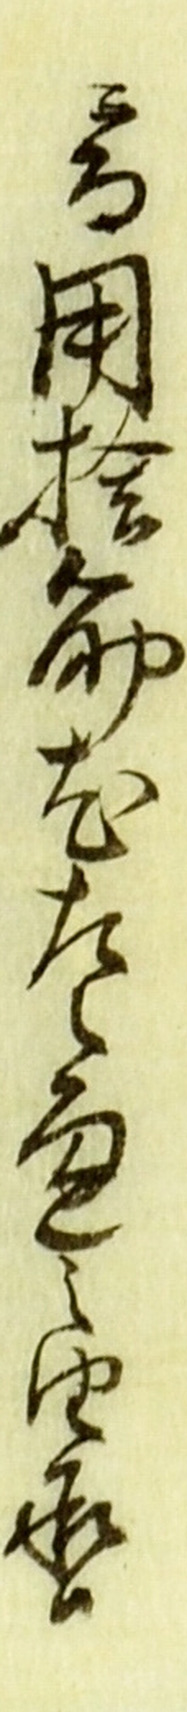二而用捨筋尤左之通之由承候
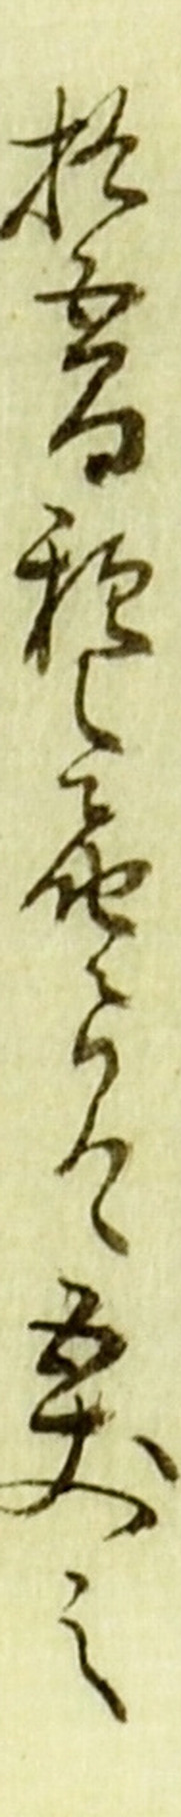十五間程之届二候ハヽ五丈之
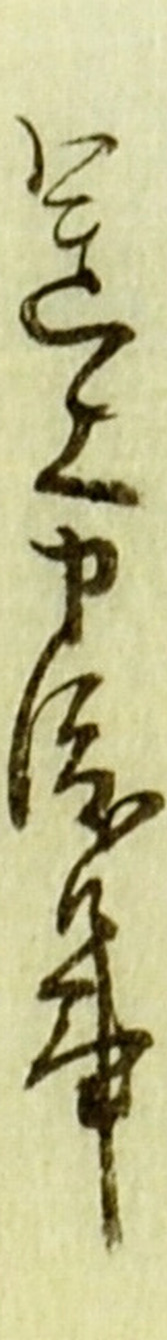運上申渡候事
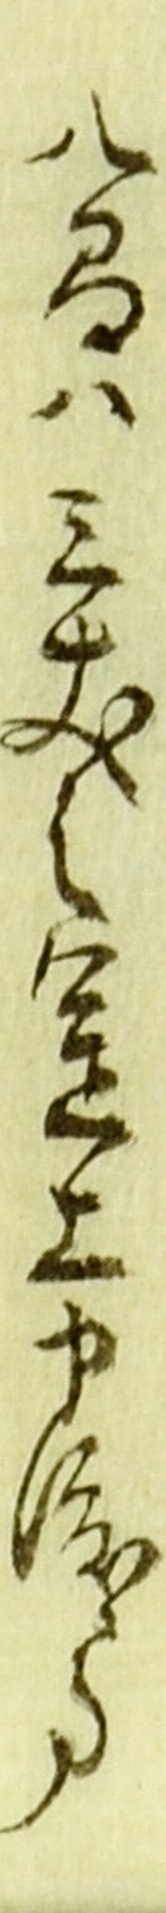八間ハ三丈之運上申渡事
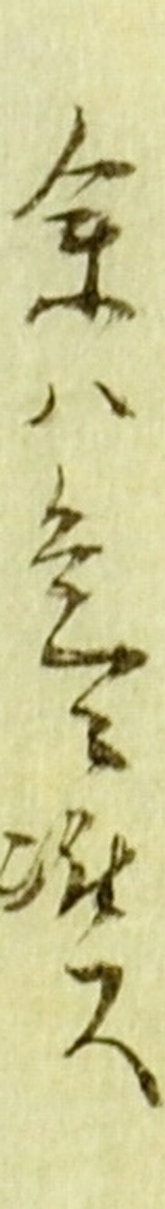余ハ是二准ス
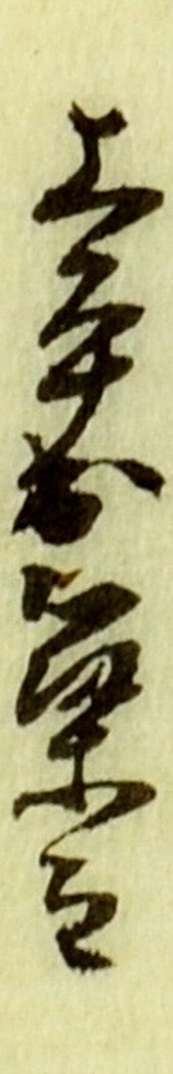上平出簗主
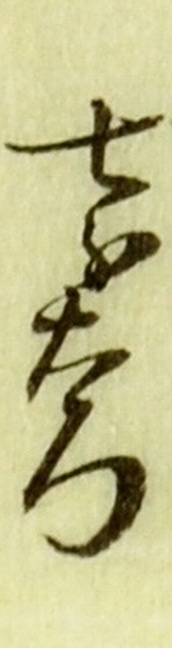七郎右衛門
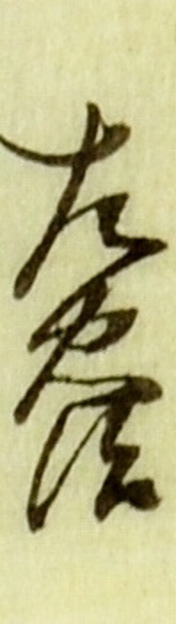左忠治
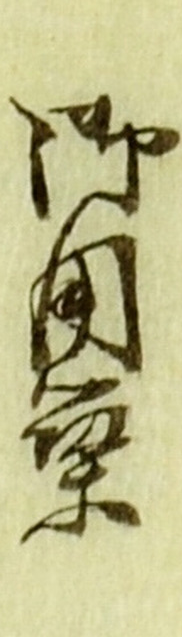御用簗
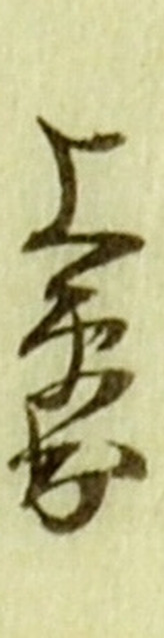上平出
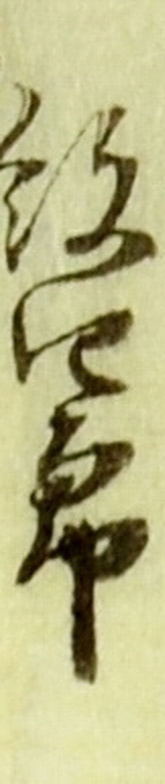紋四郎
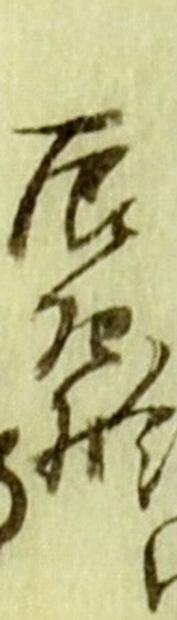紋四郎
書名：分一御定法
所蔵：伊那市立高遠町図書館・合同会社AMANE
